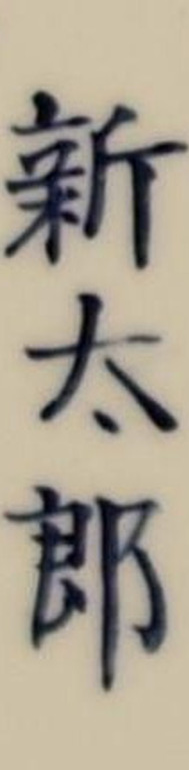新太郎
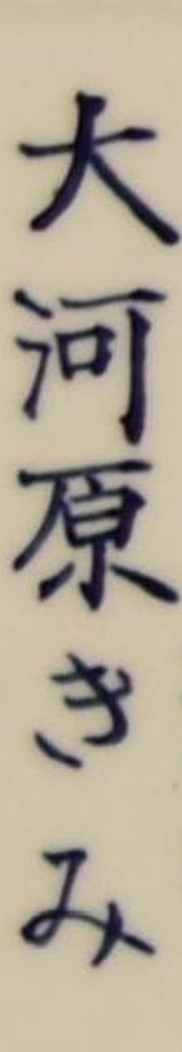大河原きみ
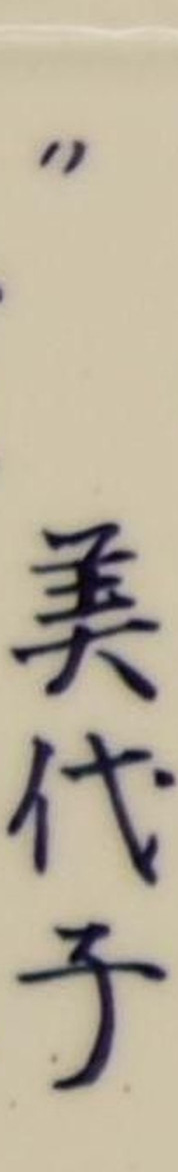美代子
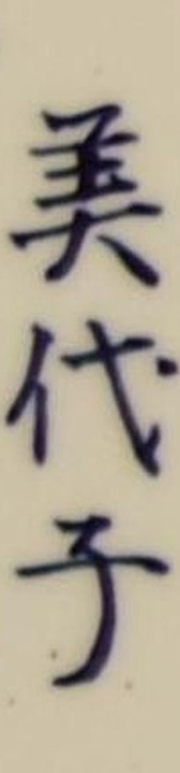美代子
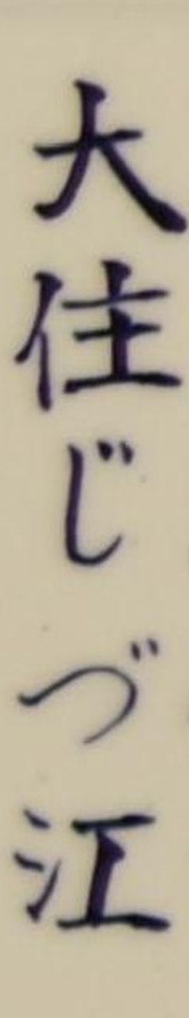大住じづ江
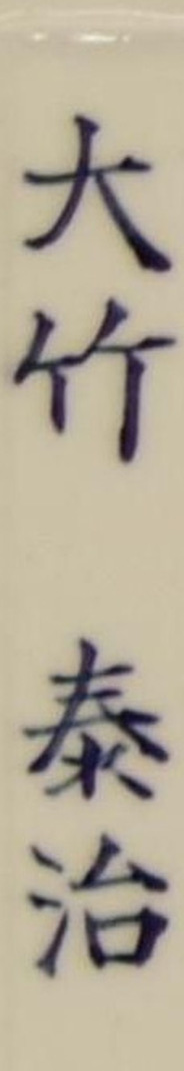大竹秦治

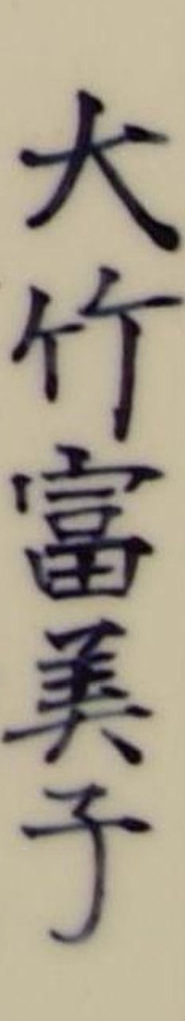大竹富美子
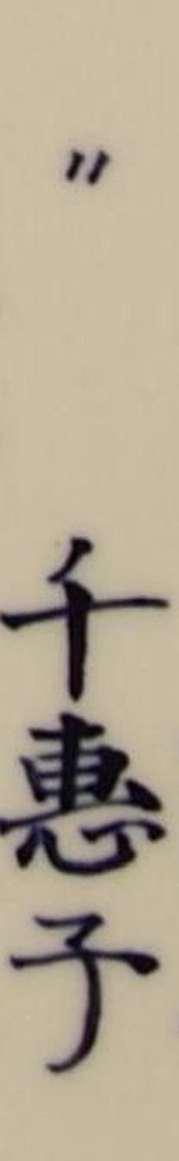千恵子
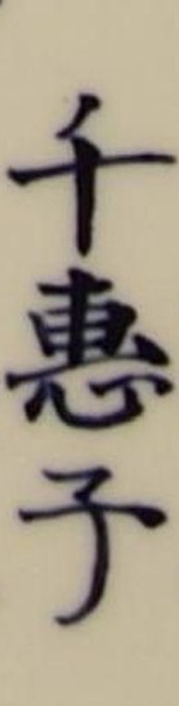千恵子
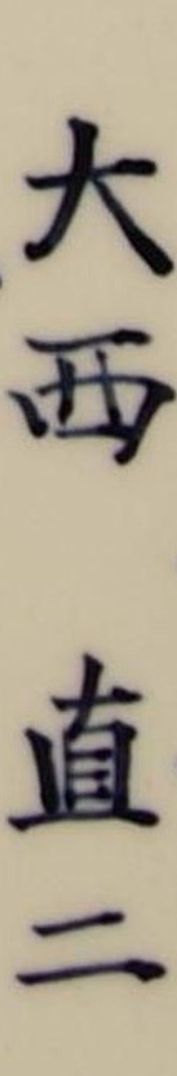大西直二
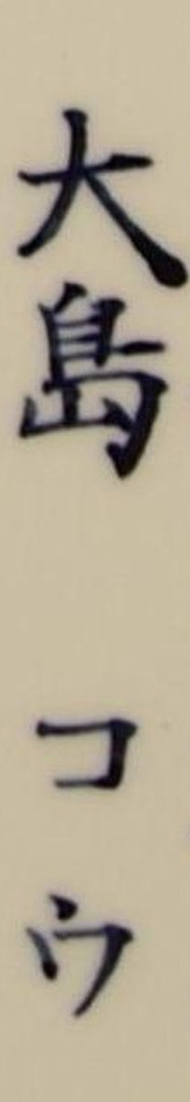大島コウ
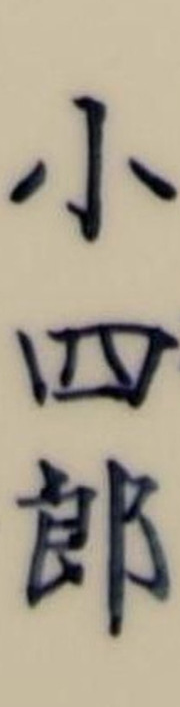小四郎
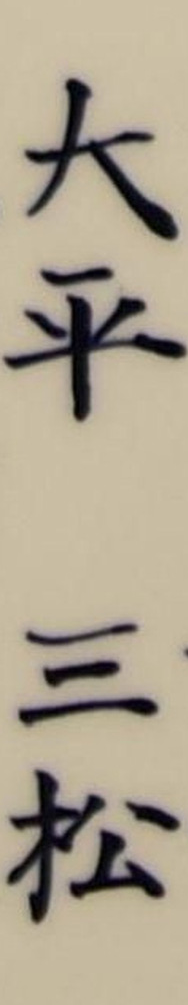大平三松
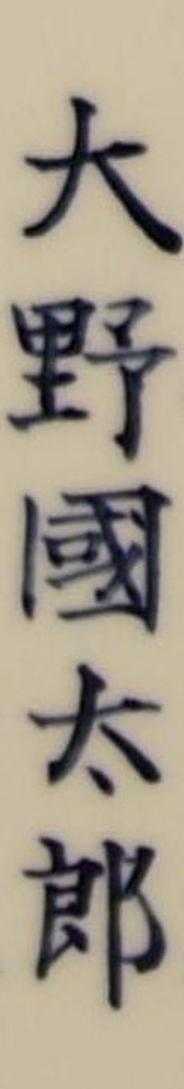大野国太郎
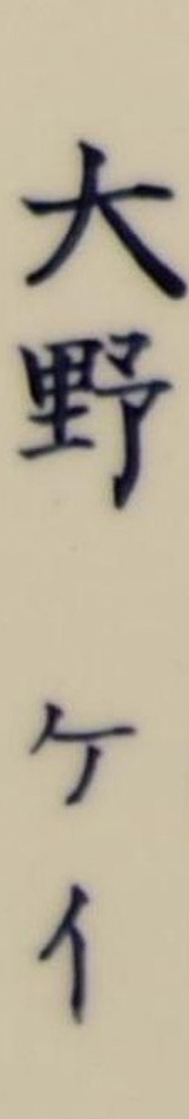大野ケイ
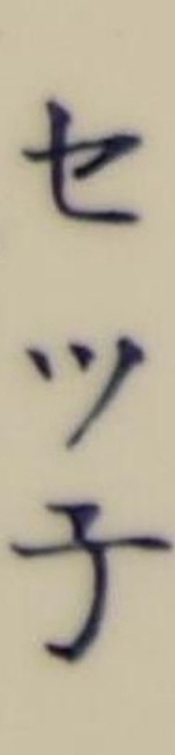セツ子
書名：A~D
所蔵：koyasan kongobuji
